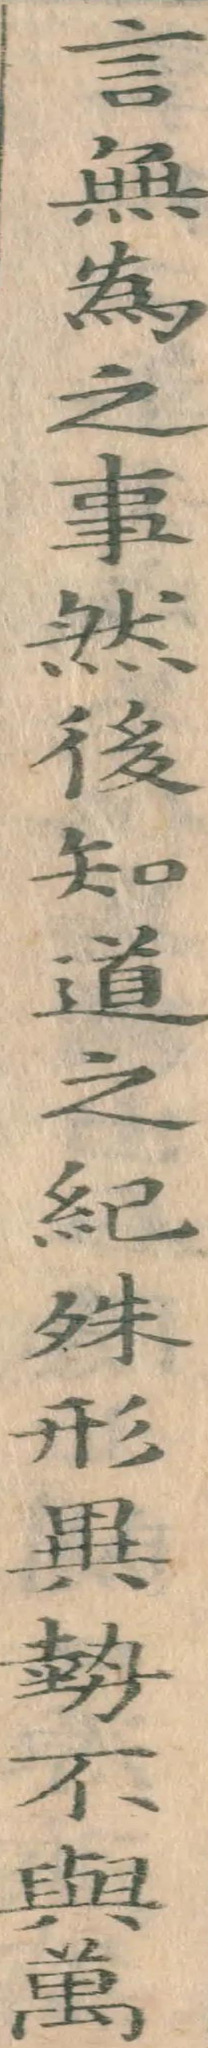言無為之事然後知道之紀殊形異勢不與万
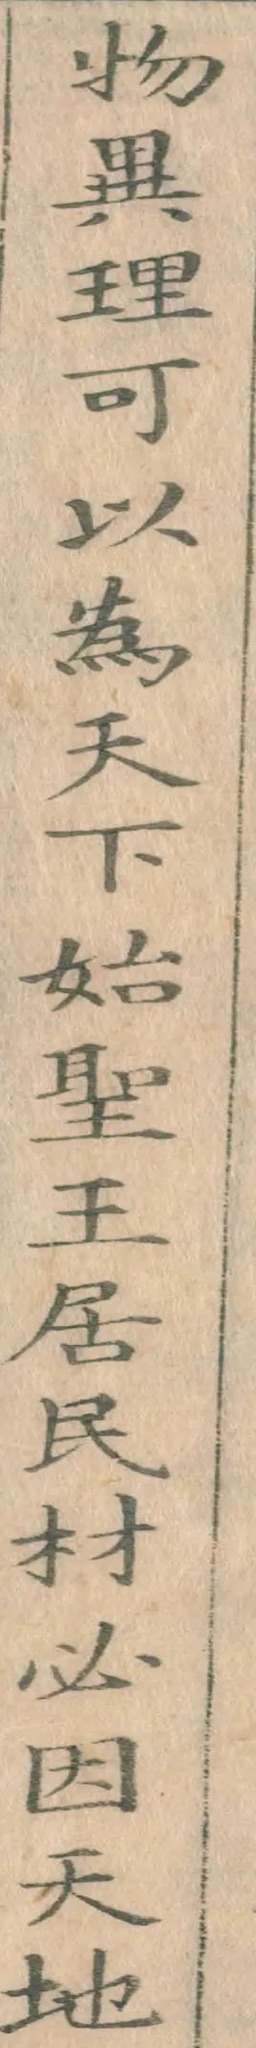物異理可以為天下始聖王居民材必因天地
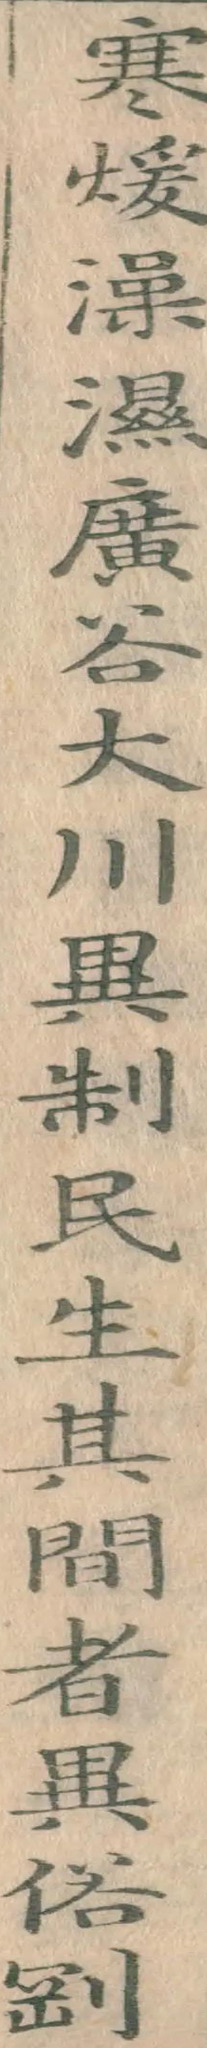寒煖澡湿広谷大川異制民生其間者異俗剛
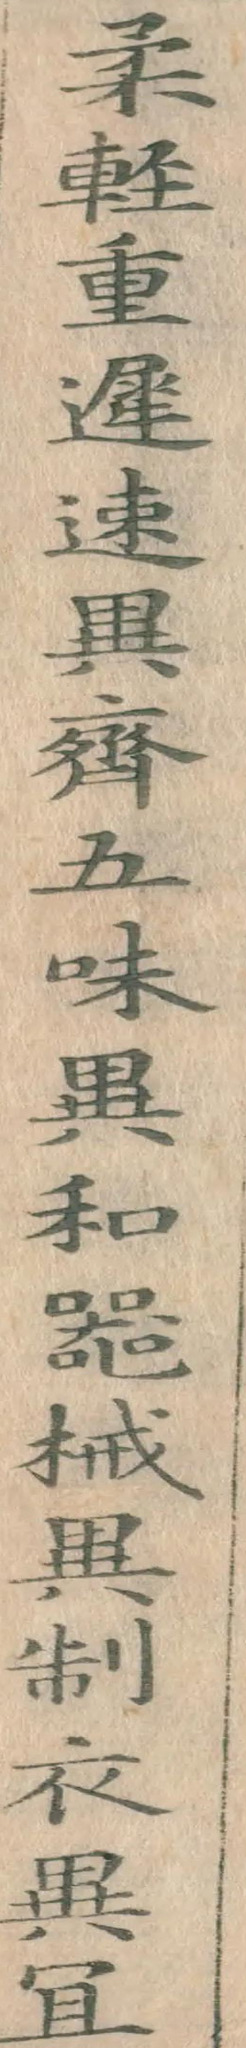柔軽重遅速異斉五味異和器械異制衣異宜
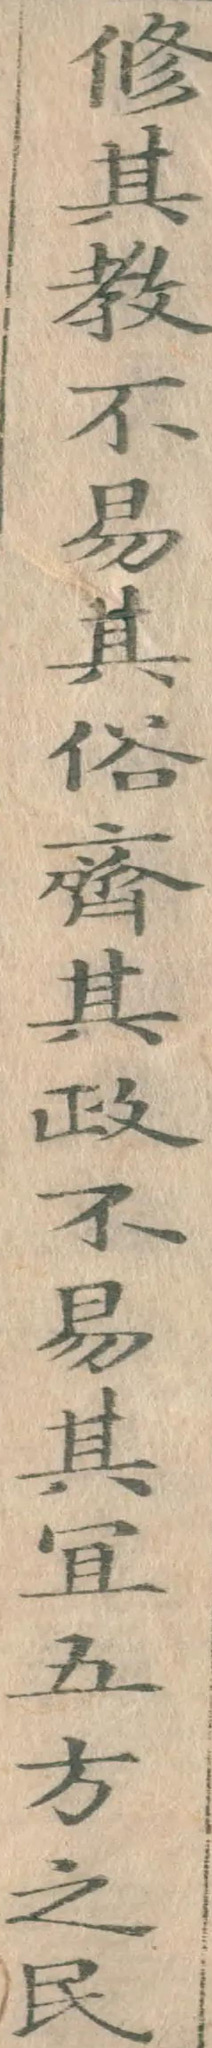修其教不易其俗斎其政不易其宜五方之民
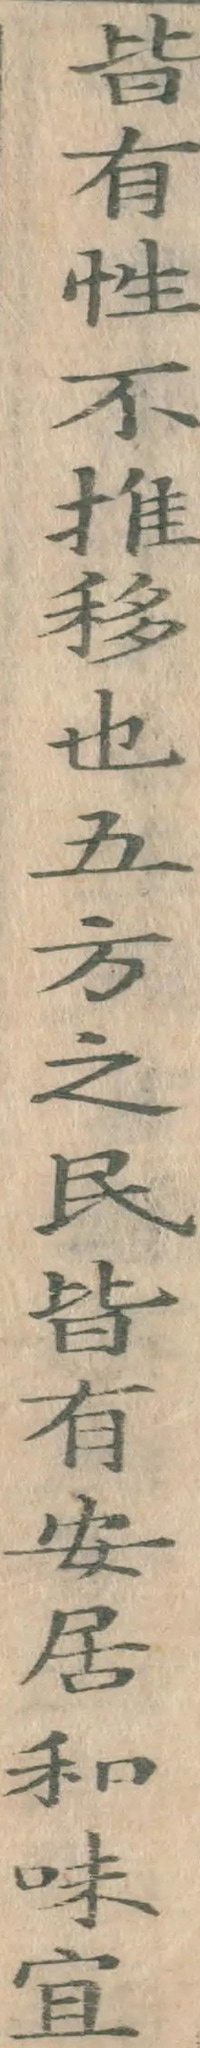皆有性不推移也五方之民皆有安居和味宜

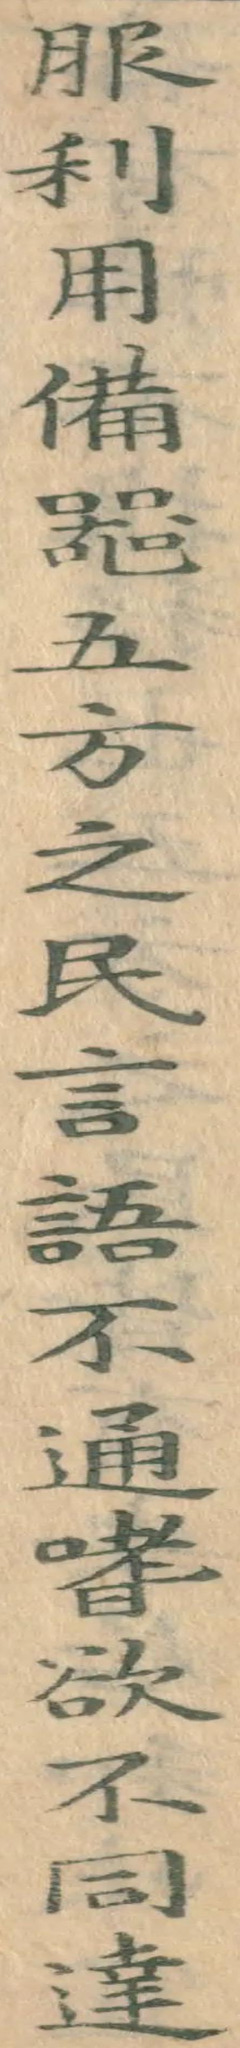服利用備器五方之民言語不通嗜欲不同達
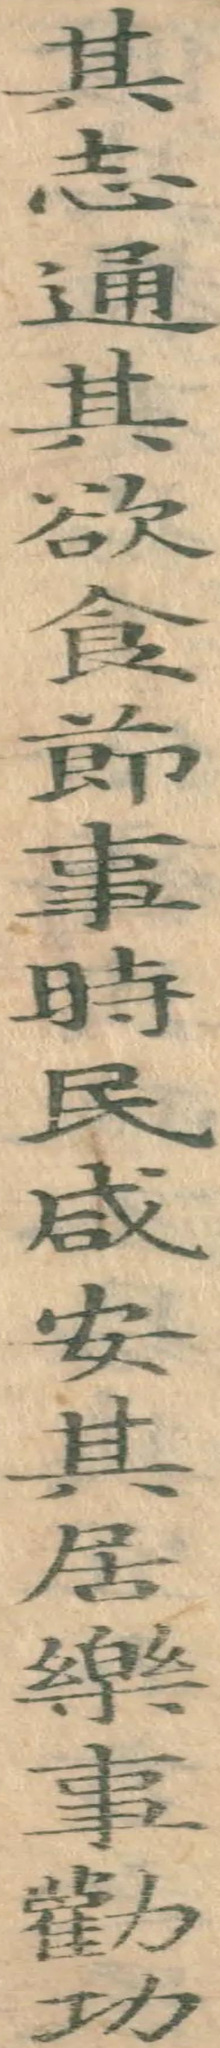其志通其欲食節事時民咸安其居楽事勤功
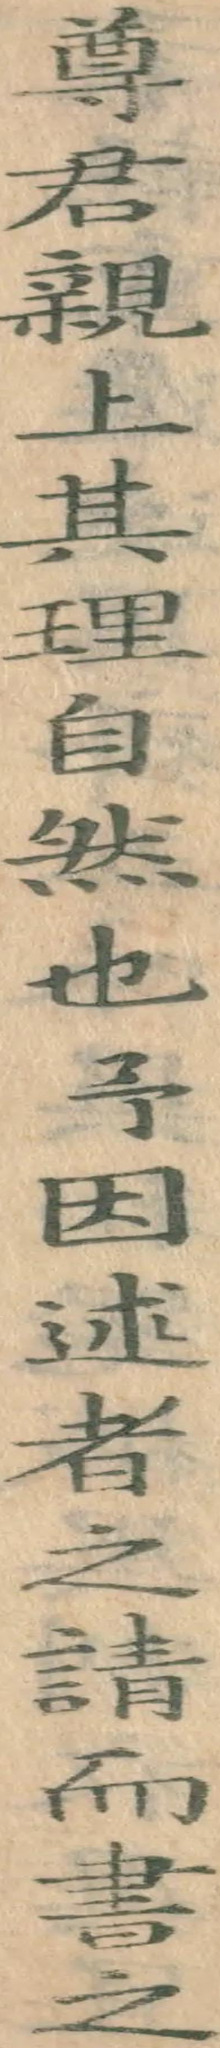尊君親上其理自然也予因述者之請而書之
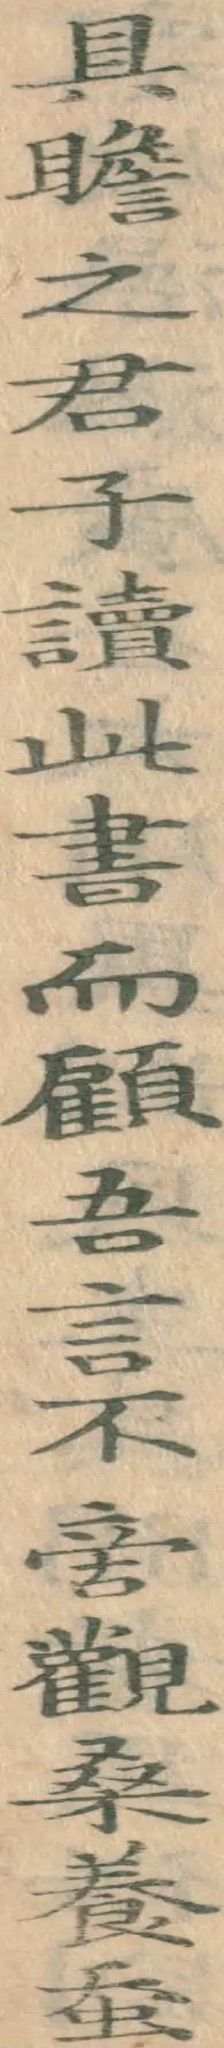具瞻之君子読此書而顧吾言不啻？観桑養蚕
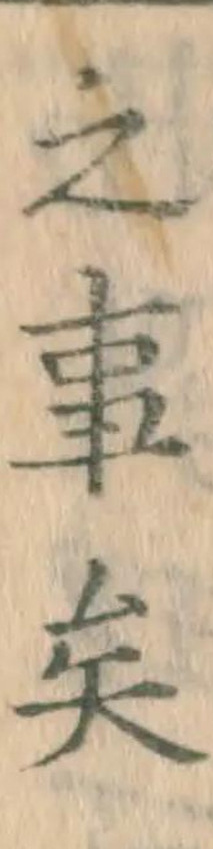之事矣
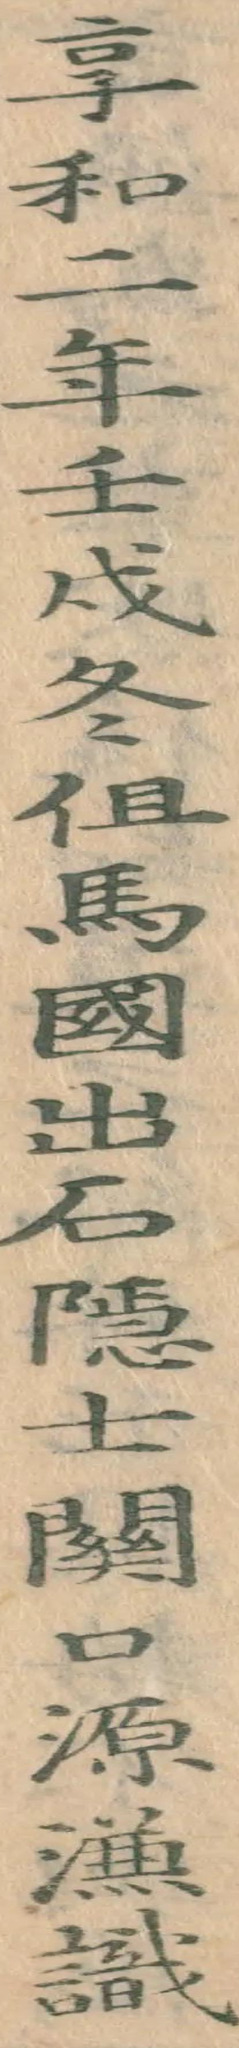享和二年壬戌冬但馬国出石隠士関口源濂？識
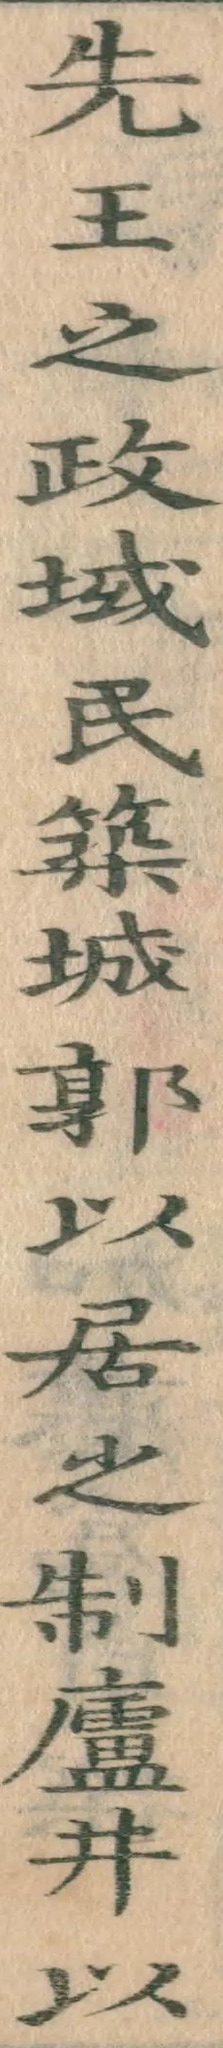先王之政城民築城郭以居之制盧井以
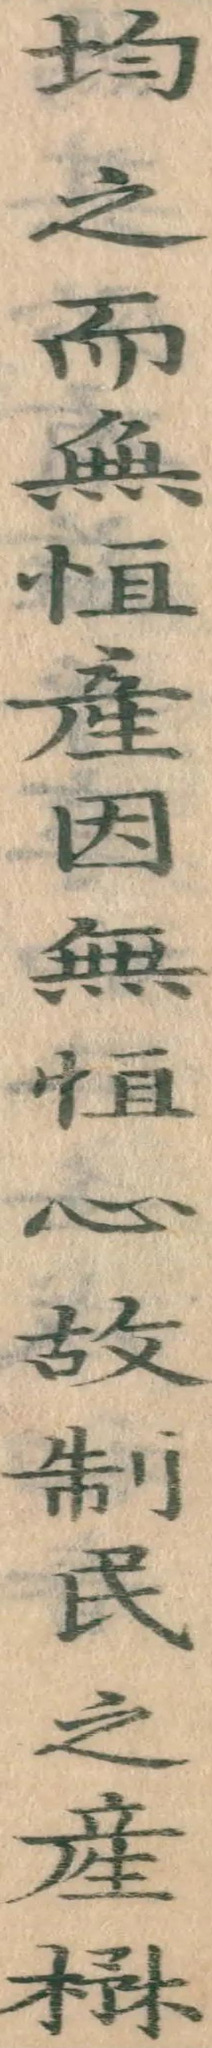均之而無恒産因無恒心故制民之産楙
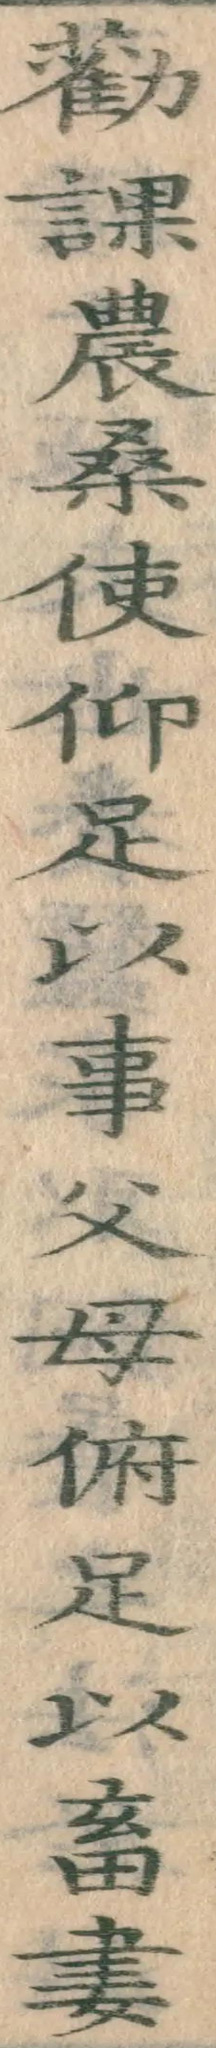勧課農桑使仰足以事父母俯足以畜妻
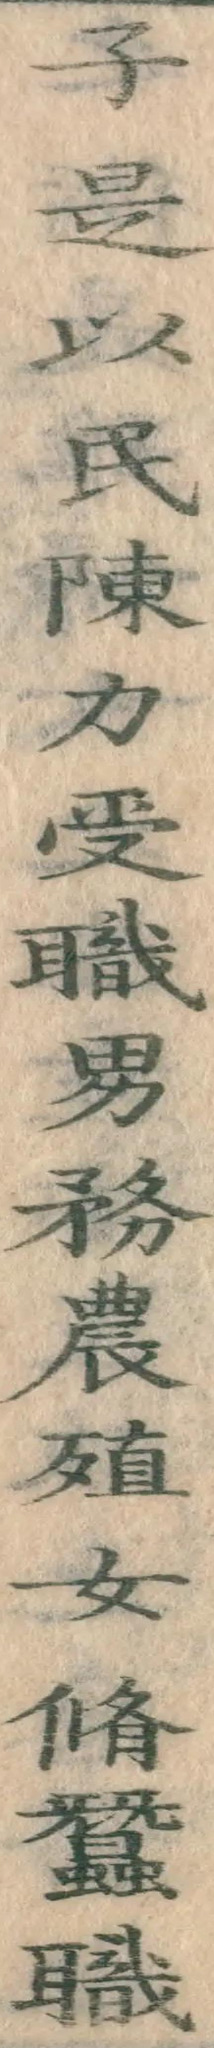子是以民陳力受職男務農殖女脩蚕職
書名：養蚕秘録 3巻. [3]
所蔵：国立国会図書館 National Diet Library, JAPAN
